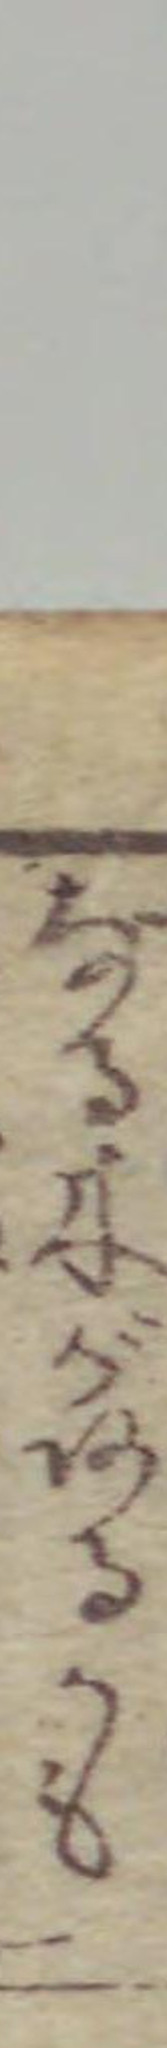なる木があるかも
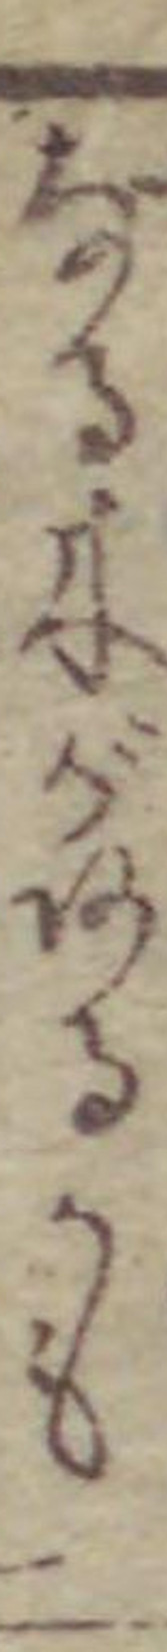なる木があるかも
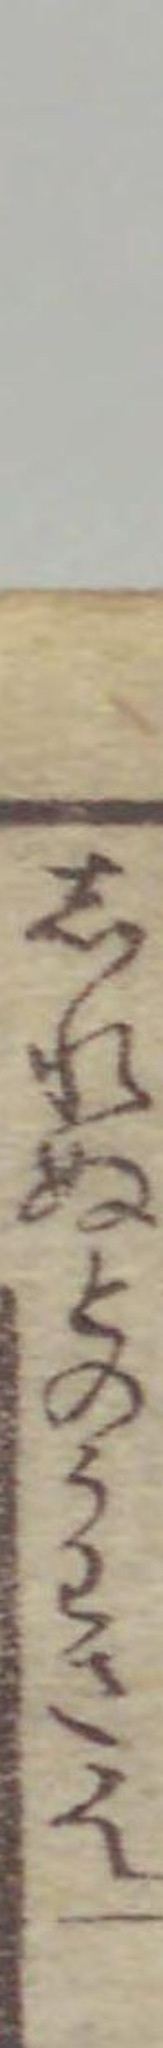しれぬとのうわさ也
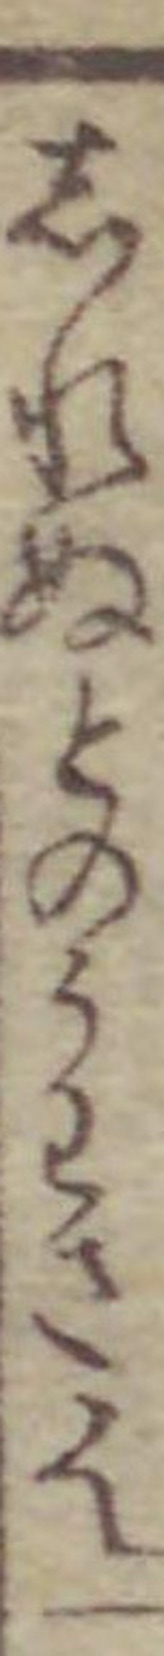しれぬとのうわさ也
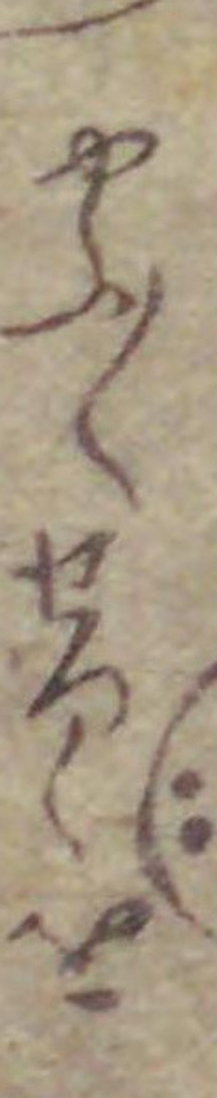やふ〳〵せつくを
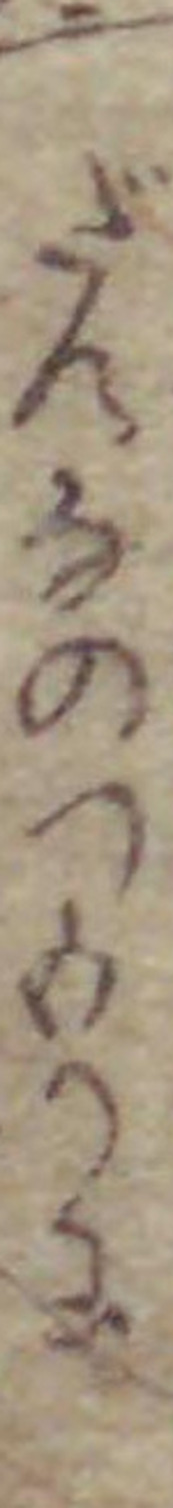だんなのつもりに
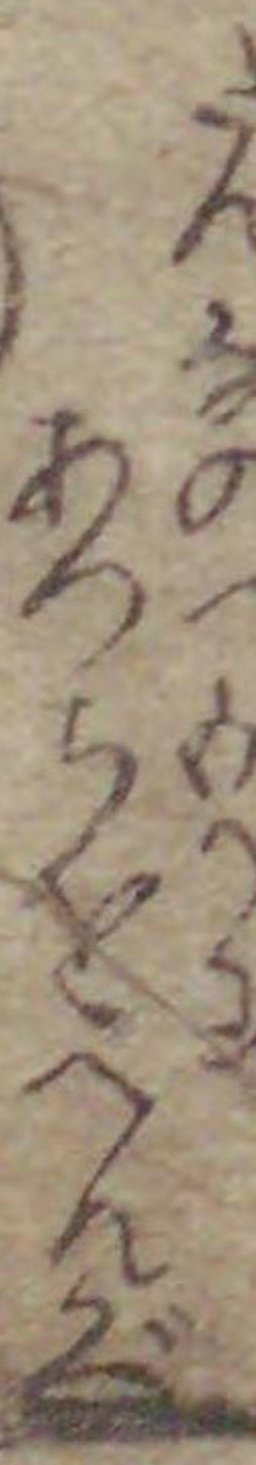あつちをへんがへ

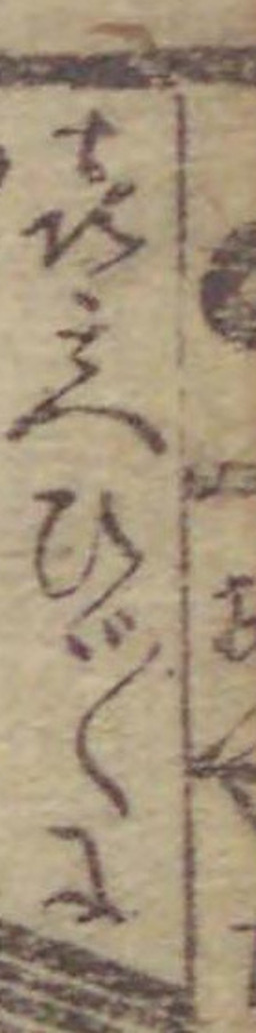喜兵へひゞ〳〵に
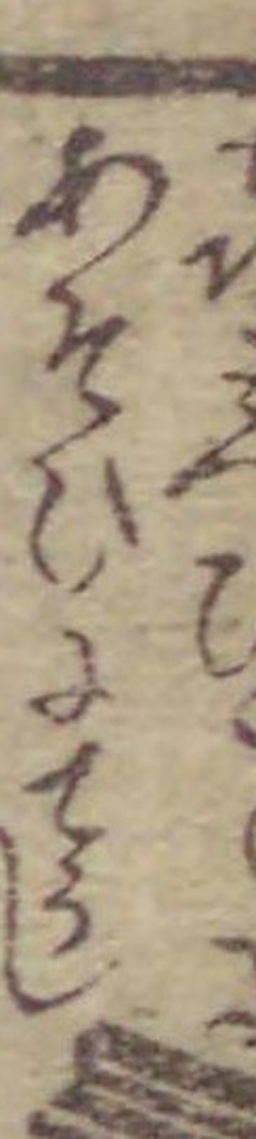あそひにてうし
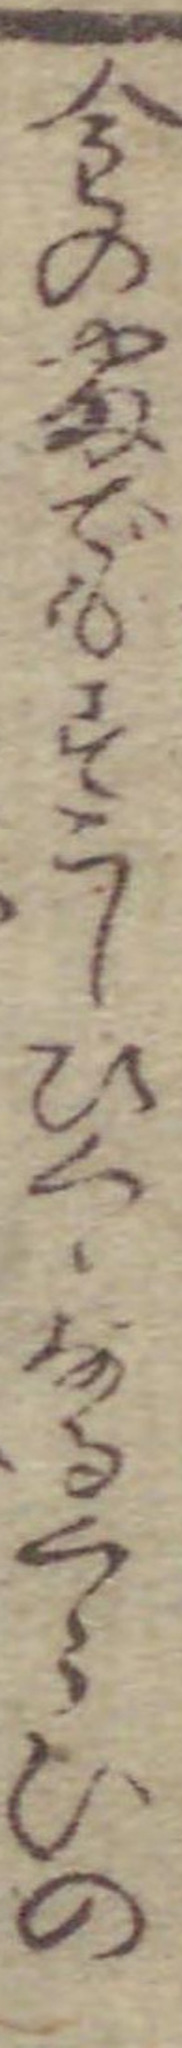金のやまでもすこしひくゝなるくらひの
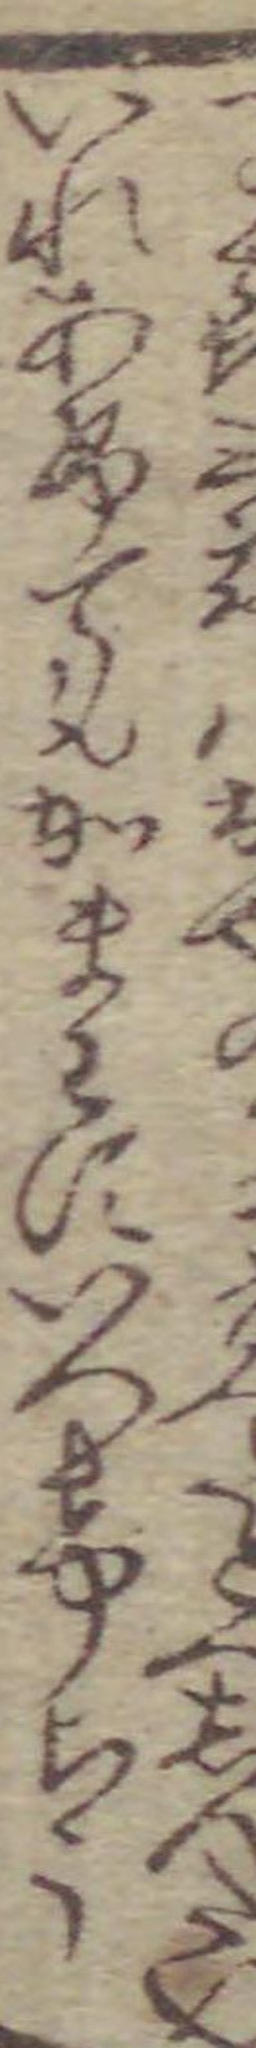いれあけてもかまわすいつけちう
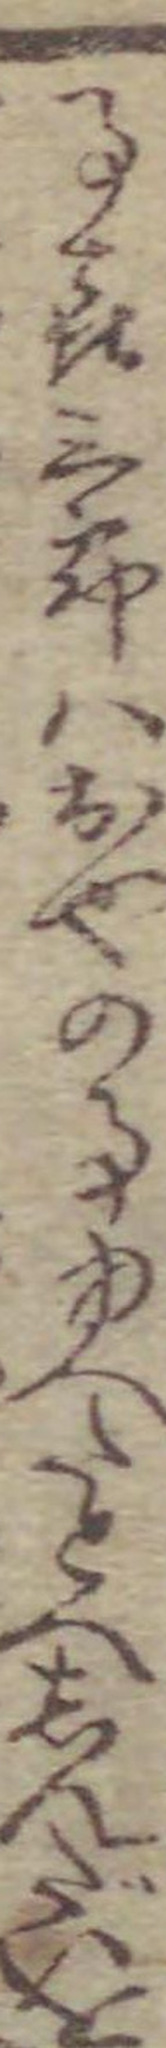事喜三郎はおやの事ゆへたとへしんだいを
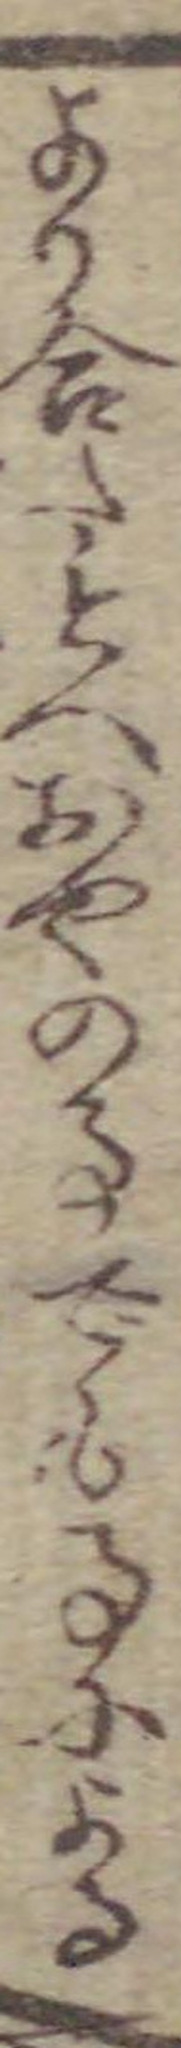より合たとへおやの事でも事による
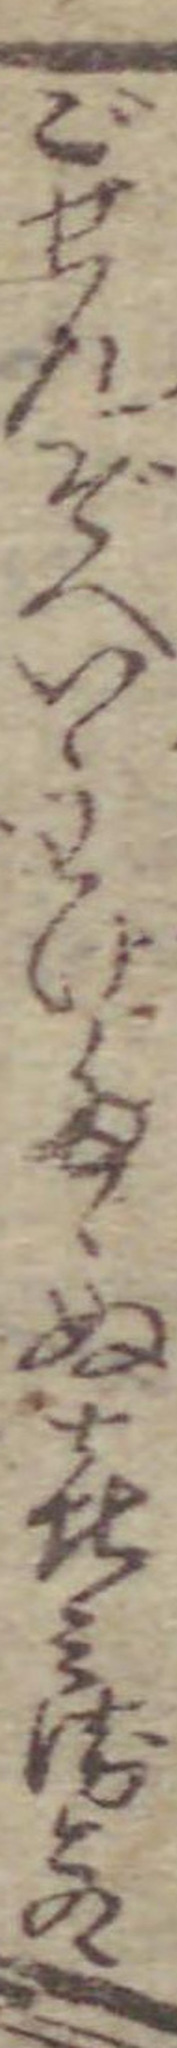ごせんぞへいゝわけたゝぬ喜兵衛とのゝ
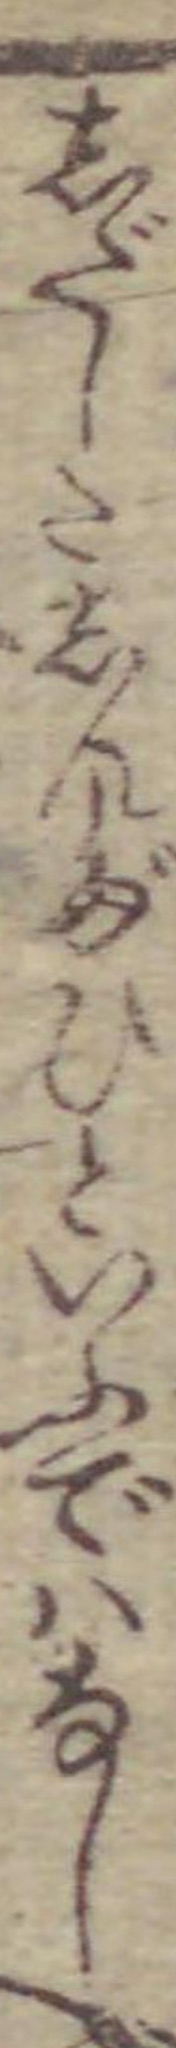しだしたしんだひといふではなし
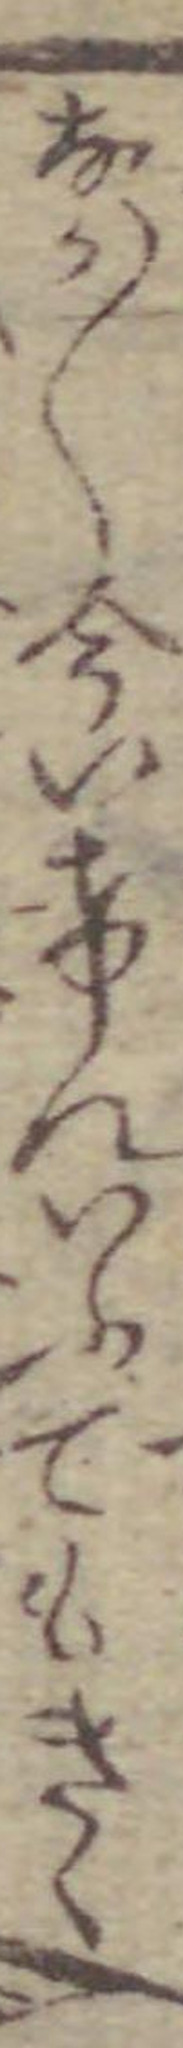なか〳〵今いけんいふてもきく
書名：親父布子鳶握 3巻
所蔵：国立国会図書館 National Diet Library, JAPAN
